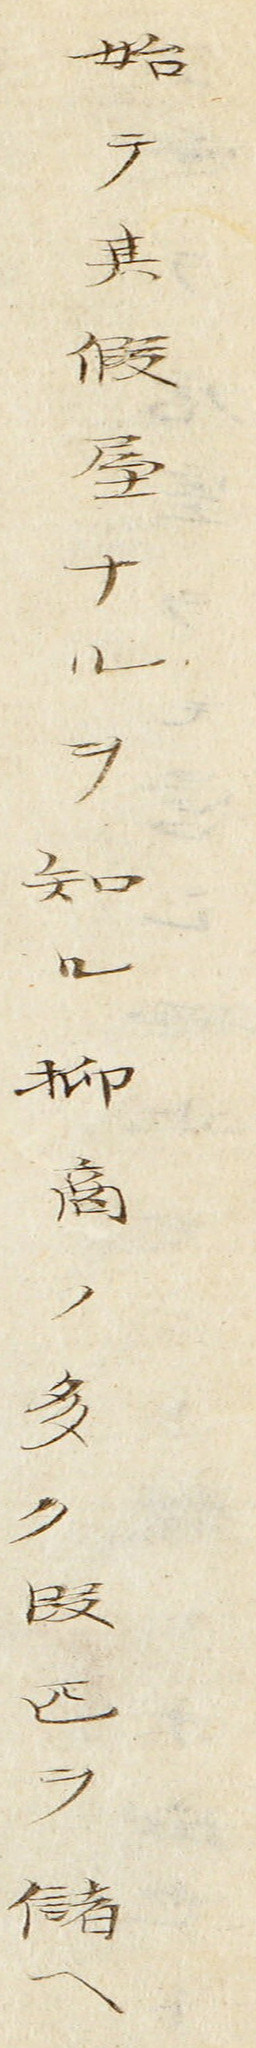始テ其仮屋ナルヲ知ル抑商ノ多ク段匹ヲ儲ヘ
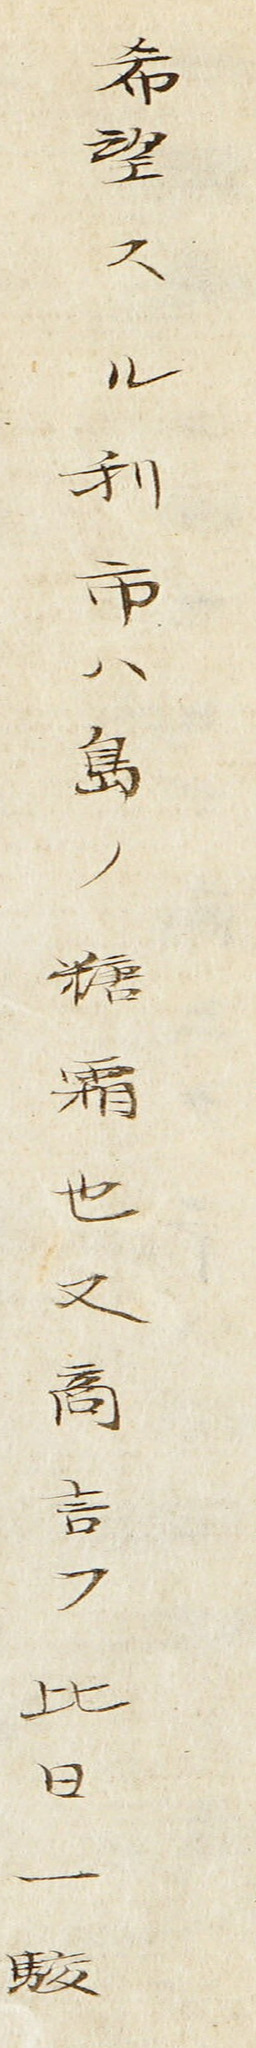希望スル利市ハ島ノ糖霜也又商言フ比日一駿
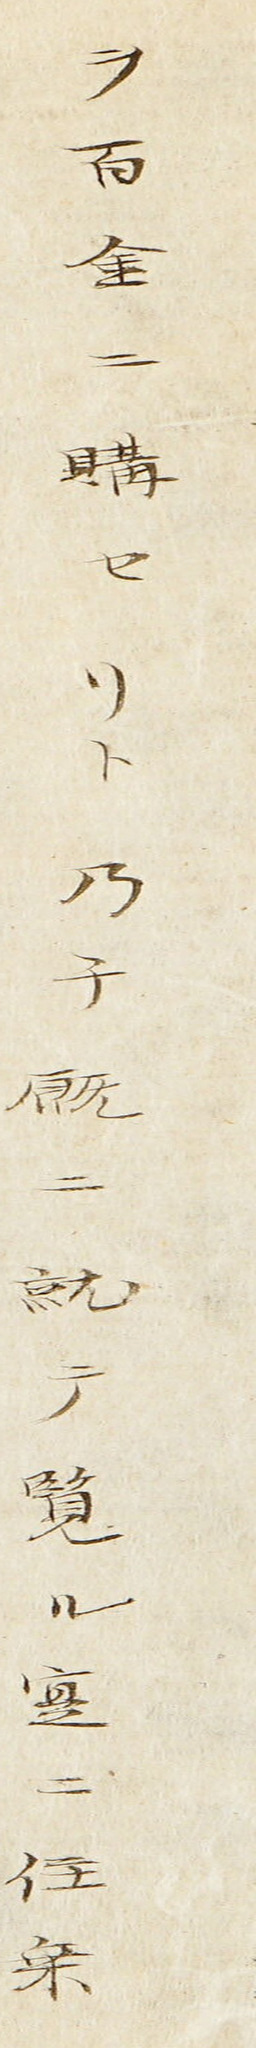ヲ百金ニ購セリト乃チ厩ニ就テ覧ル寔ニ住乗
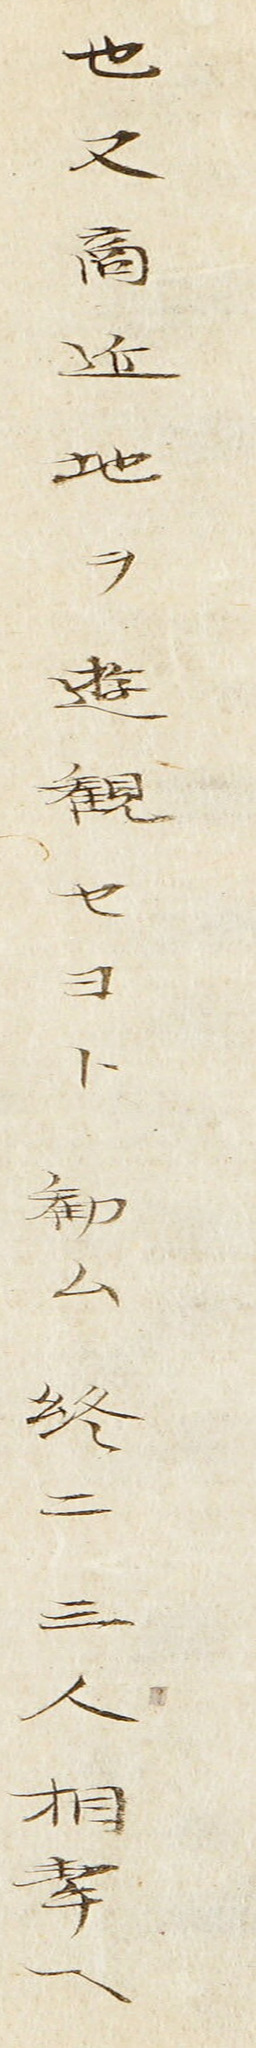也又商近地ヲ遊観セヨト勧ム終ニ三人相挈ヘ
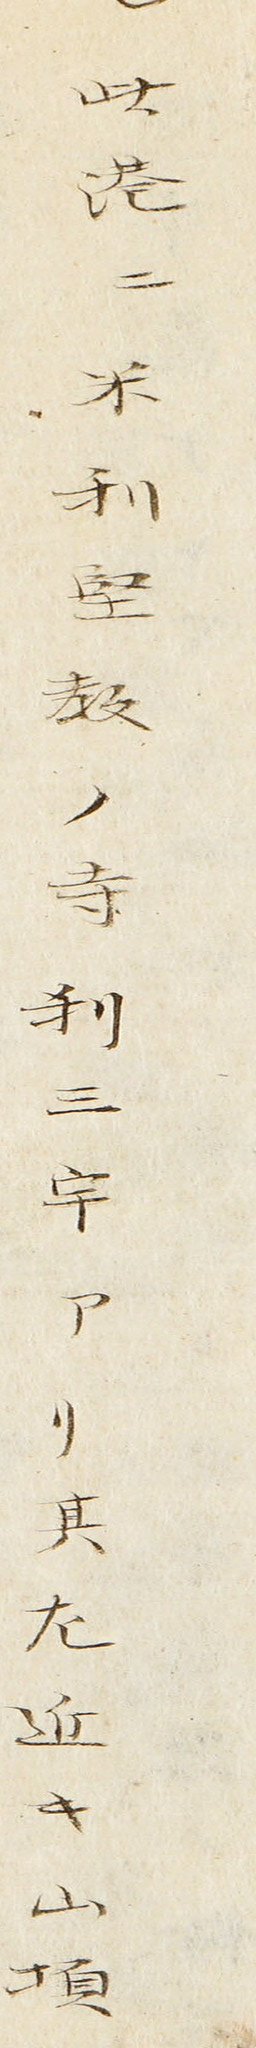○此港ニ米利堅教ノ寺刹三宇アリ其左近キ山項
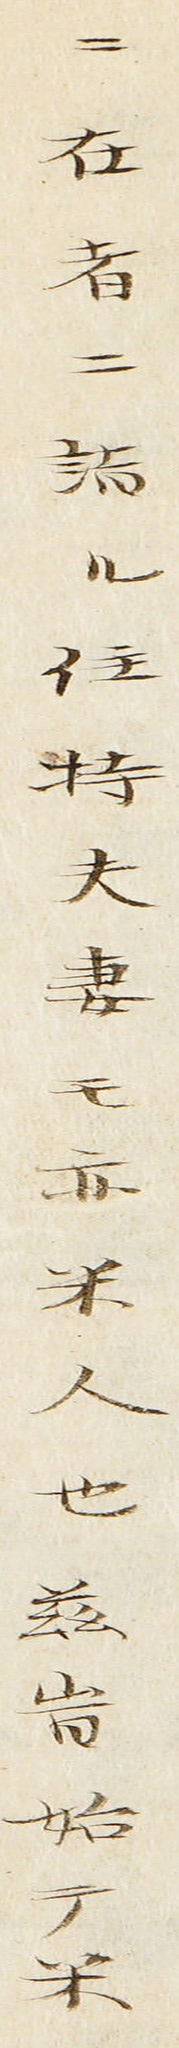ニ在者ニ詣ル住持夫妻モ亦米人也茲旹始テ米
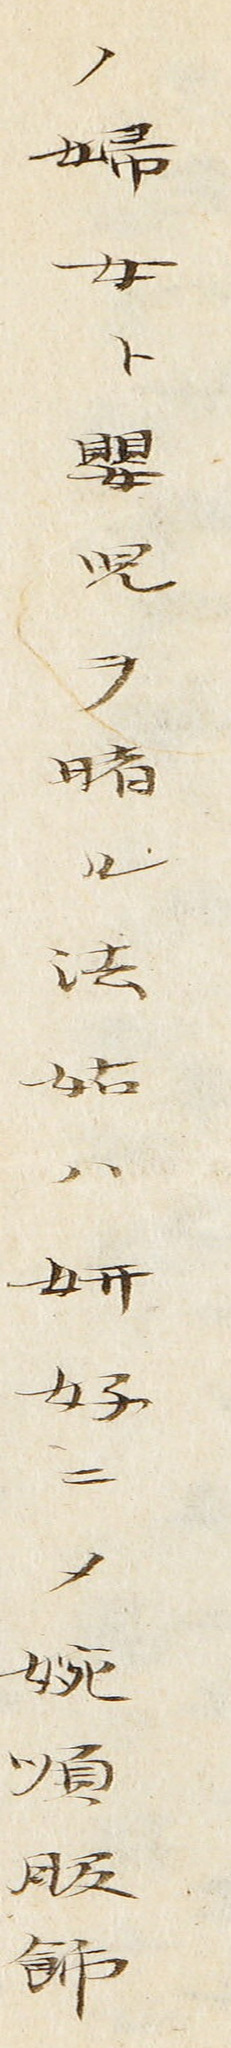ノ婦女ト嬰児ヲ睹ル法姑ハ妍好ニシテ婉順服飾
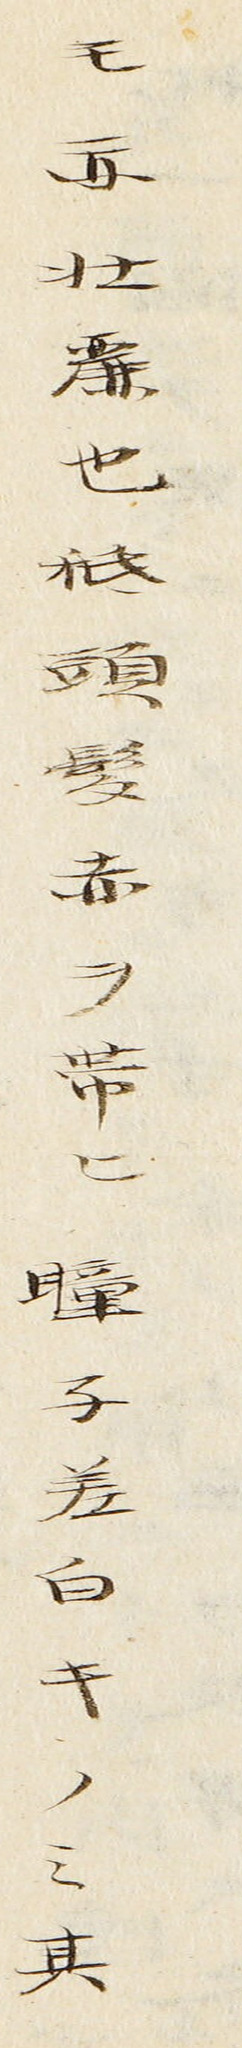モ亦壮麗也秪頭髪赤ヲ帯ヒ瞳子差白キノミ其
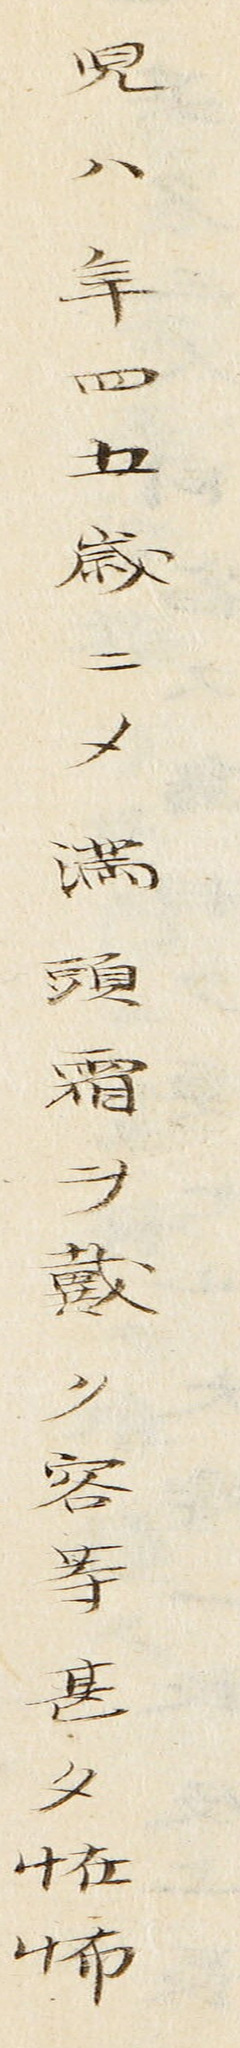児ハ年四五歳ニシテ満頭霜ヲ戴ク客等甚タ恠怖
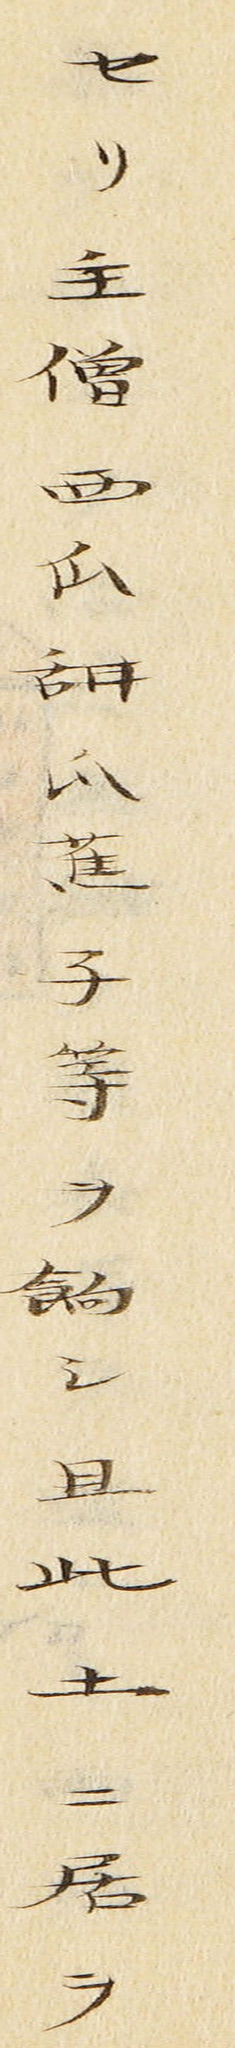セリ主僧西瓜甜瓜蕉子等ヲ餉シ且此土ニ居ヲ
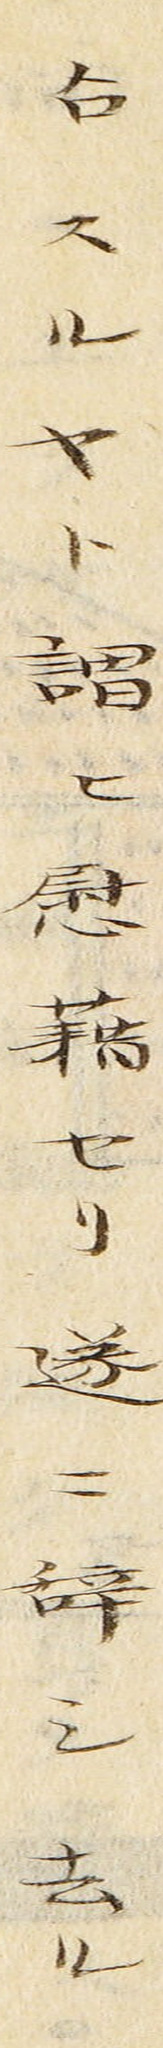占スルヤト謂ヒ慰藉セリ遂ニ辞シ去ル
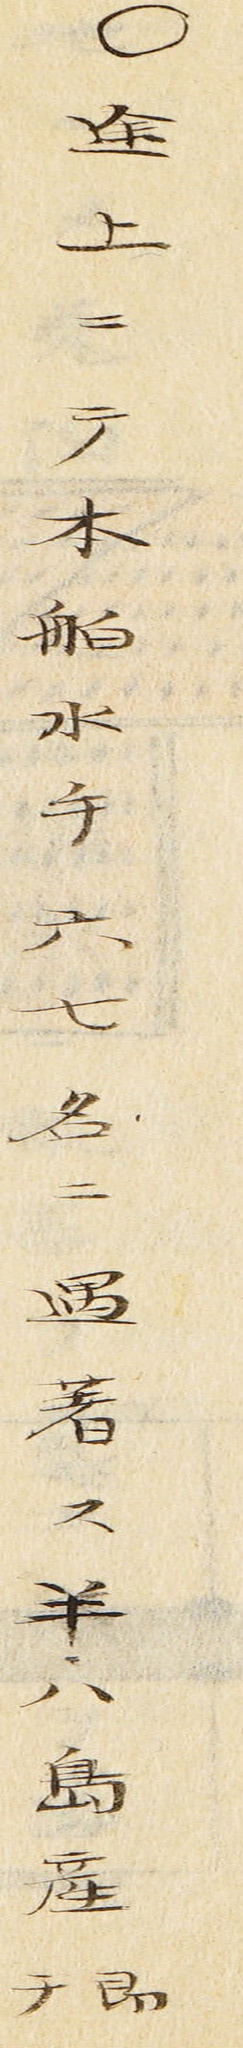○途上ニテ本舶水手六七名ニ遇著ス半ハ島産即チ
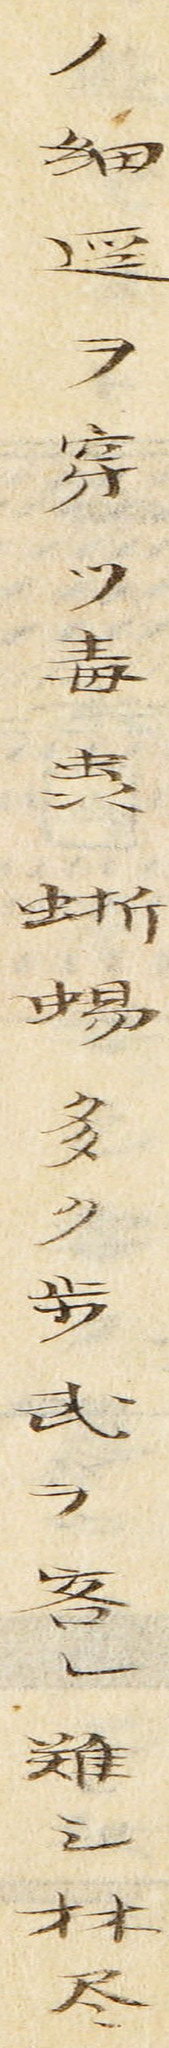ノ細逕ヲ穿ツ毒虫蜥蜴多ク歩武ヲ客レ難シ林尽
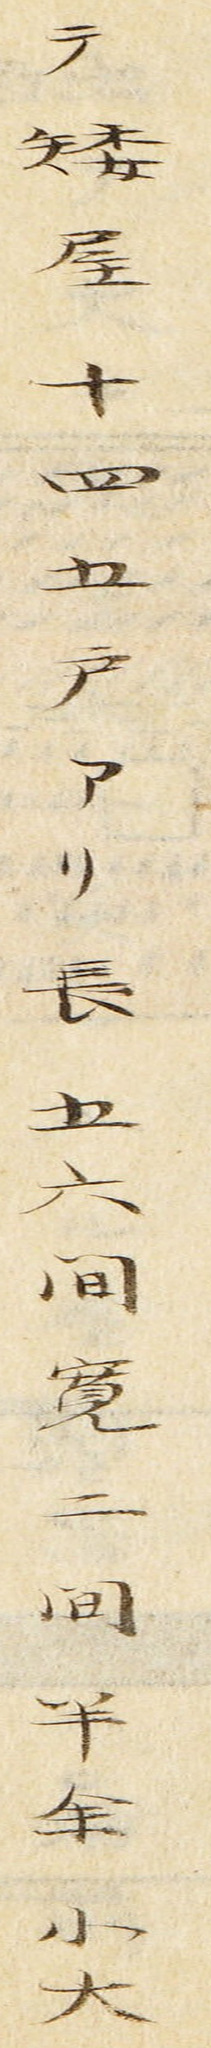テ矮屋十四五戸アリ長五六間寛二間半余小大
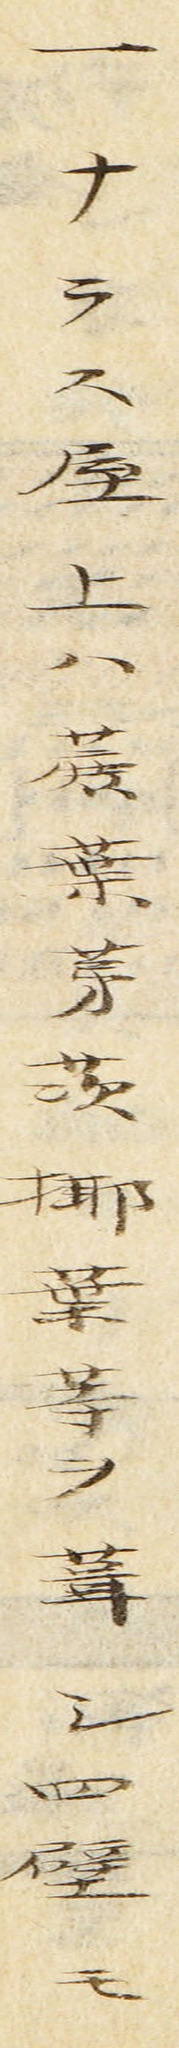一ナラス屋上ハ蔗葉茅茨椰葉等ヲ葺シ四壁モ
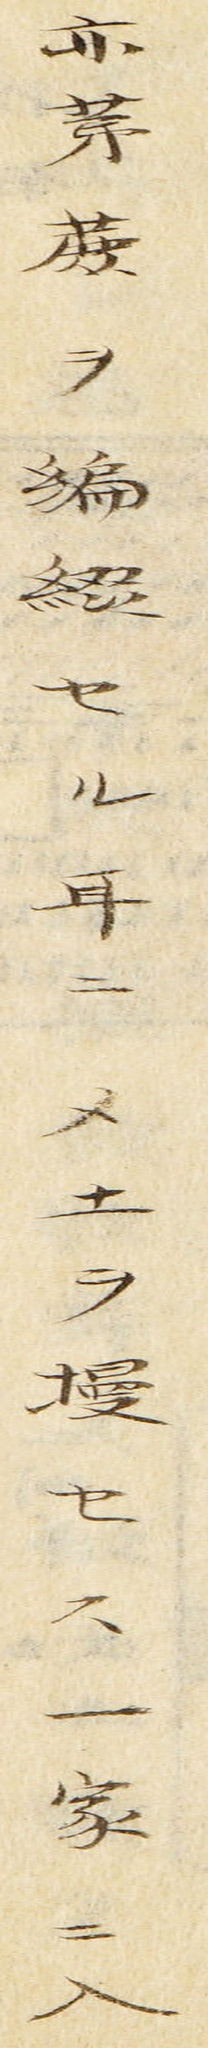亦茅蔗ヲ編綴セル耳ニシテ土ヲ墁セス一家ニ入
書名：流蕃通書
